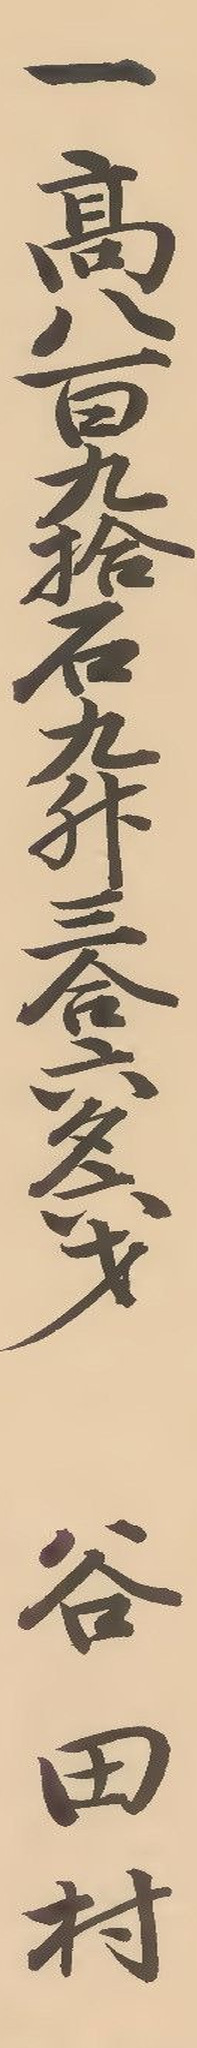一高八百九拾石九升三合六勺六才谷田村

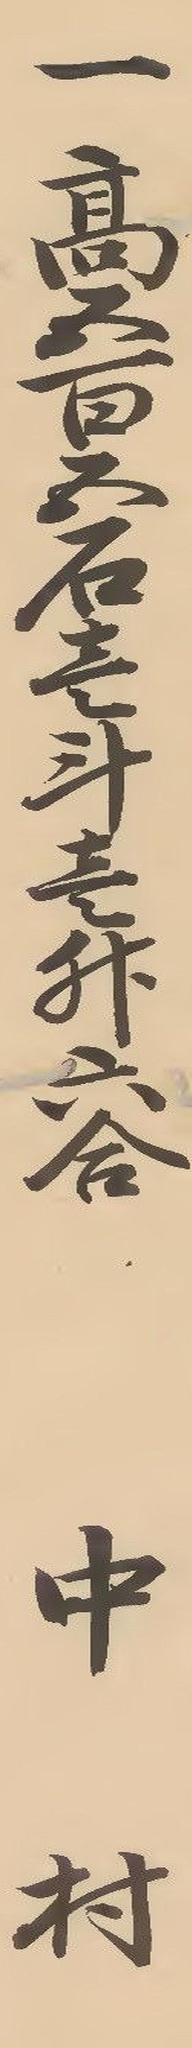一高五百五石壱斗壱升六合中村
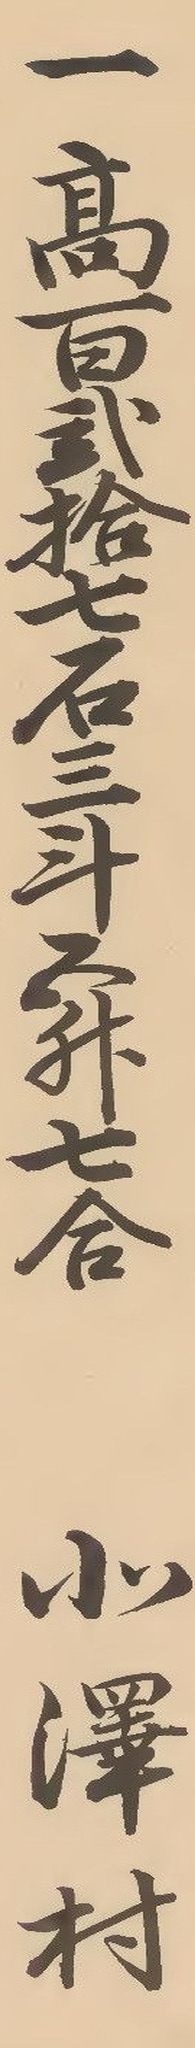一高百弐拾七石三斗五升七合北沢村
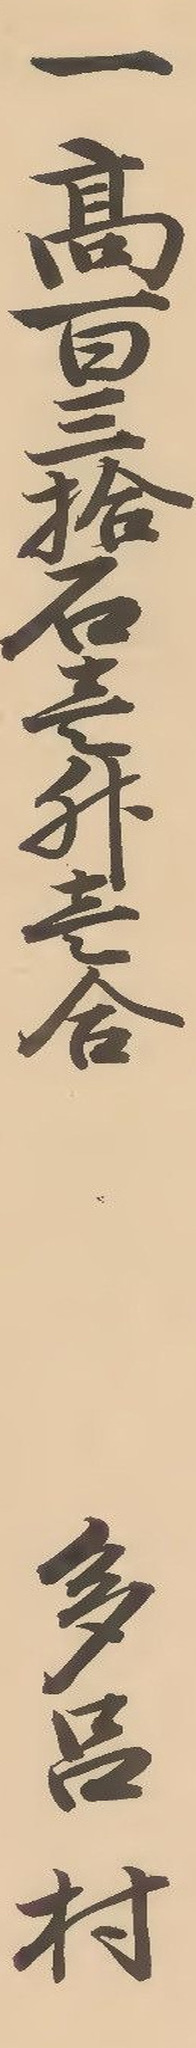一高百三拾石壱升壱合多呂村
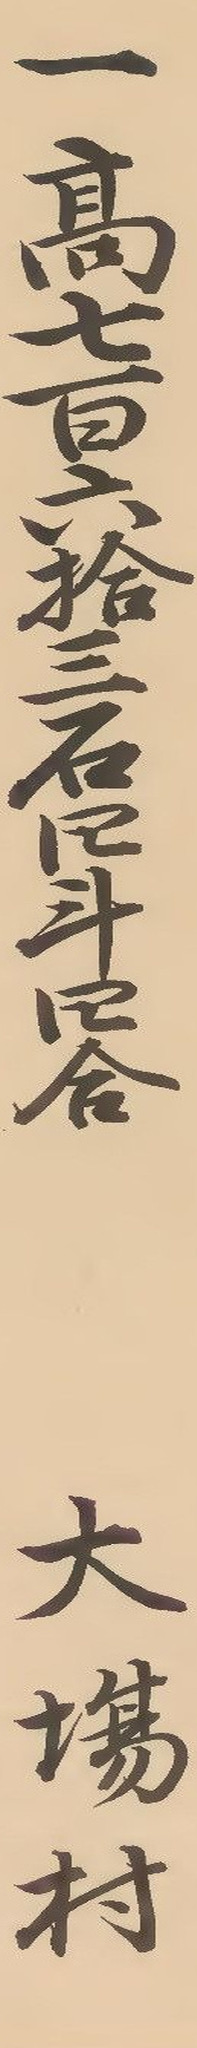一高七百六拾三石四斗四合大場村
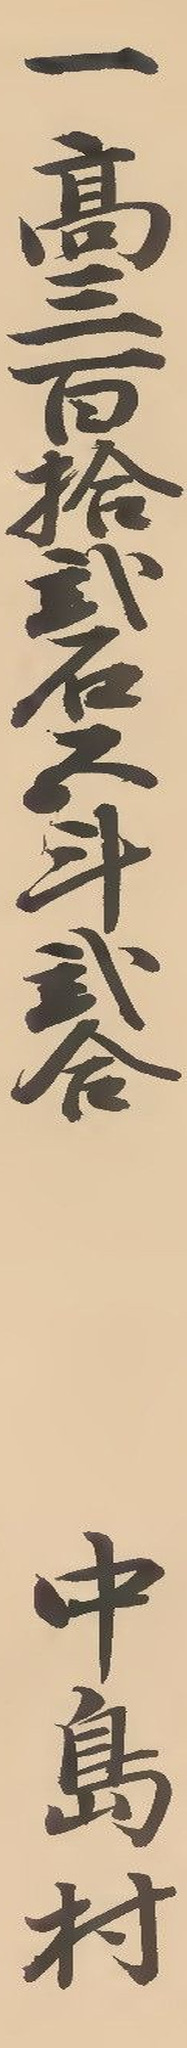一高三百拾弐石五斗弐合中島村
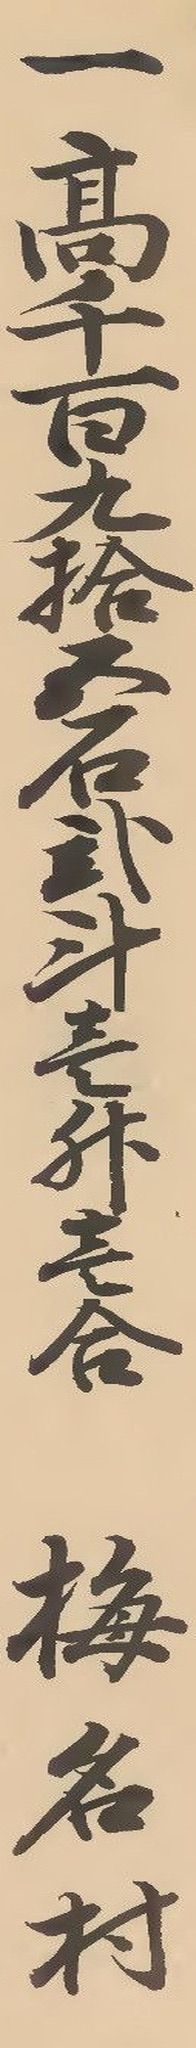一高千百九拾五石弐斗壱升壱合梅名村
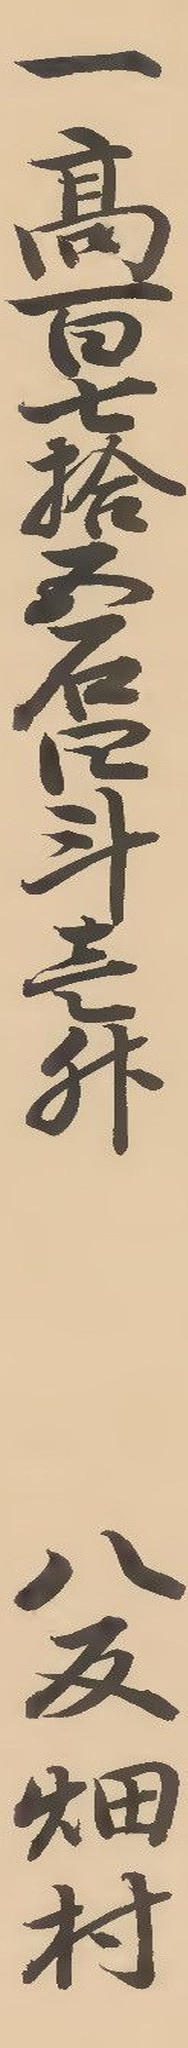一高百七拾五石四斗壱升八反畑村
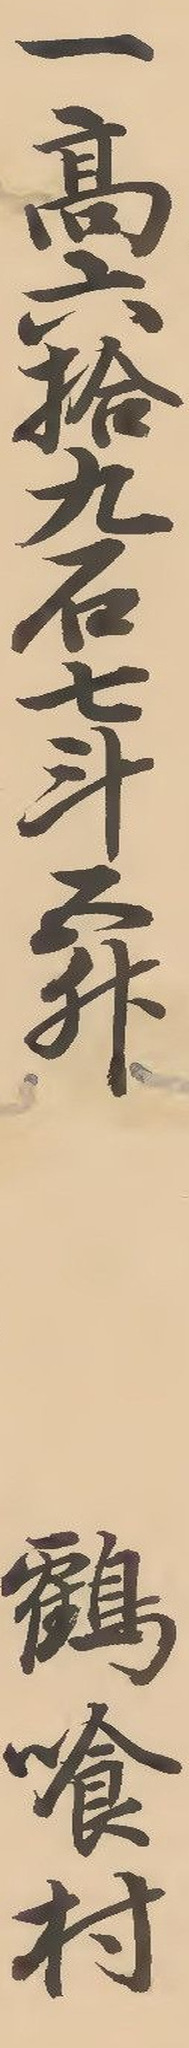一高六拾九石七斗五升鶴喰村

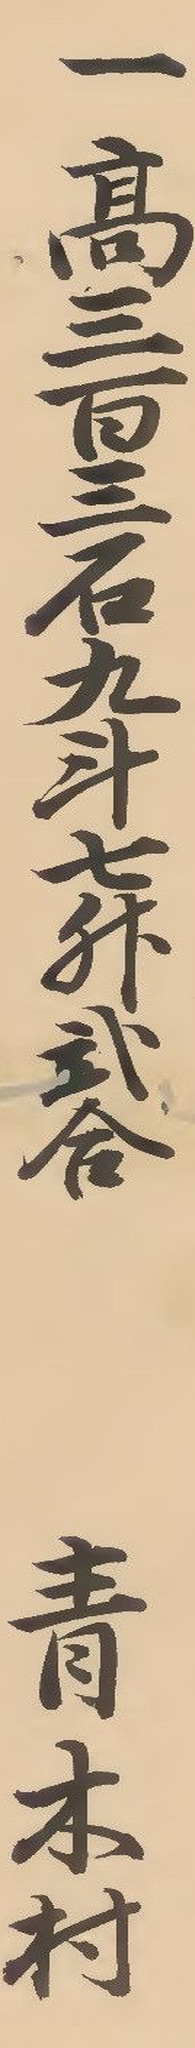一高三百三石九斗七升弐合青木村
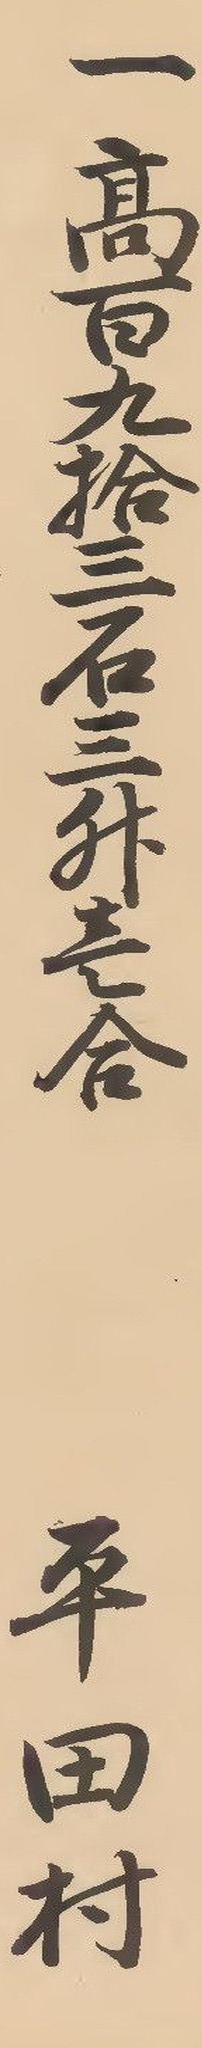一高百九拾三石三升壱合平田村
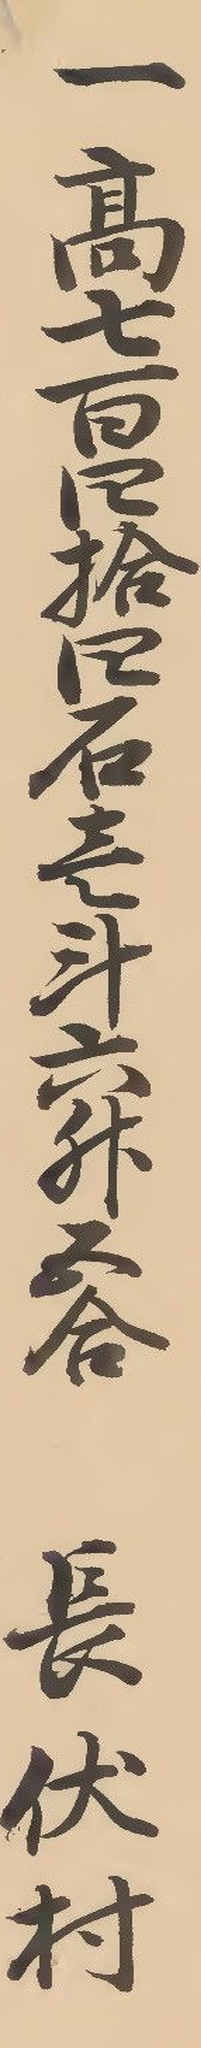一高七百四拾四石壱斗六升五合長伏村
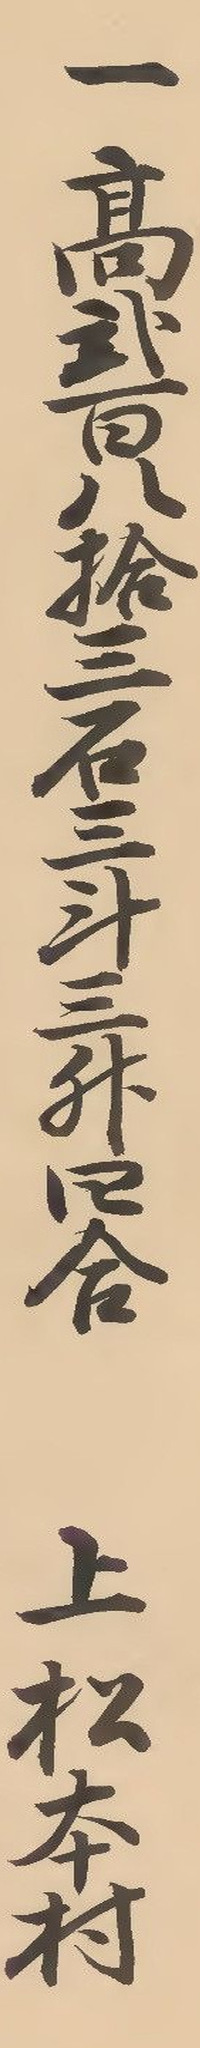一高弐百八拾三石三斗三升四合上松本村
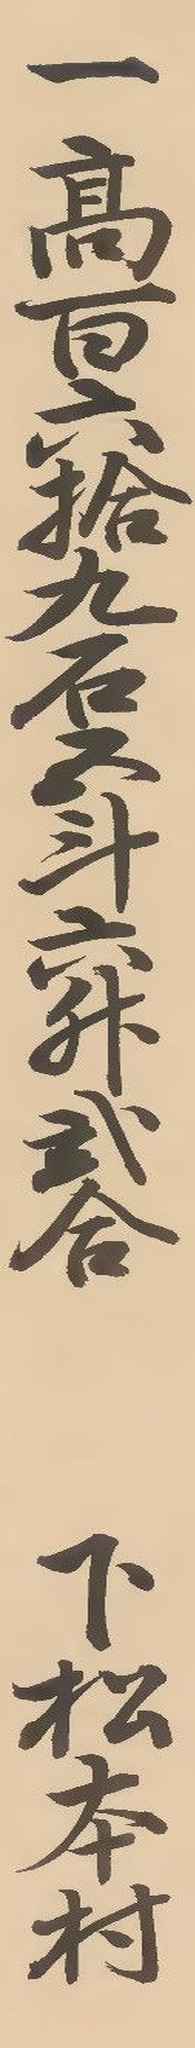一高百六拾九石五斗六升弐合下松本村
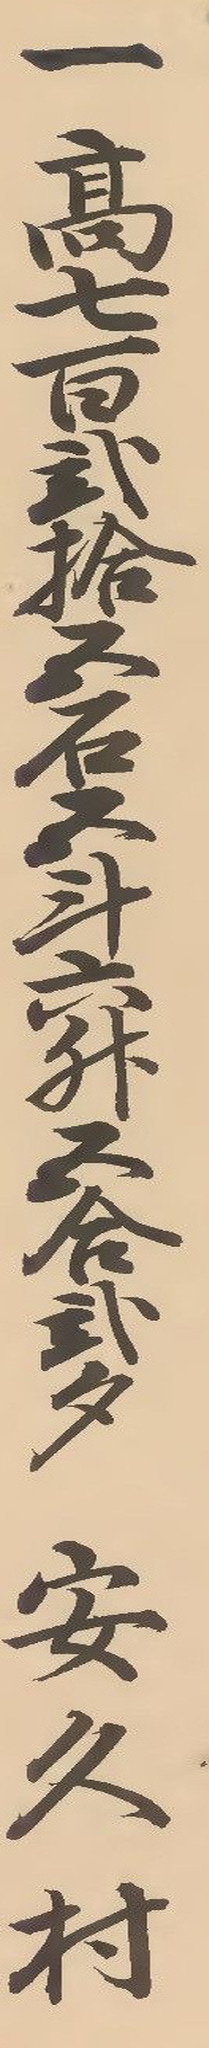一高七百弐拾五石五斗六升五合弐勺安久村
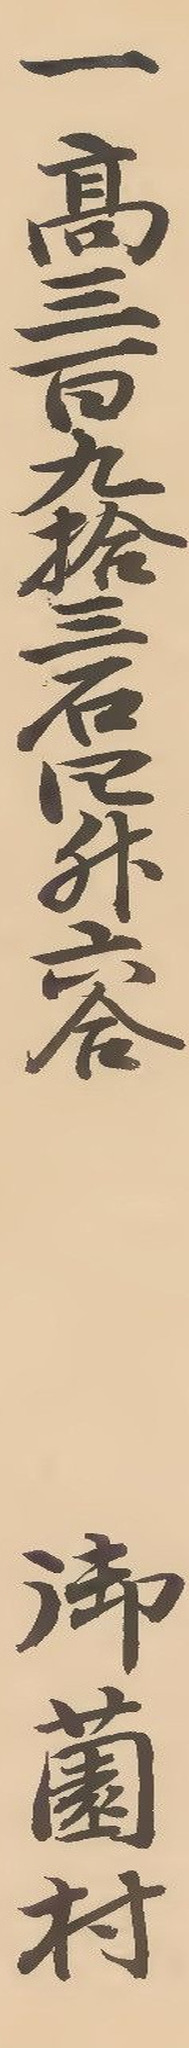一高三百九拾三石四升六合御薗村
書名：伊豆国郷帳
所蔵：国立公文書館 National Archives of Japan
